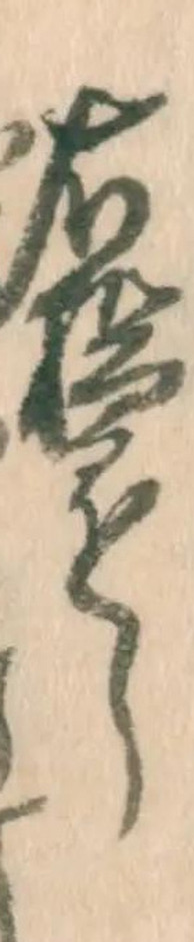右橋懸リ
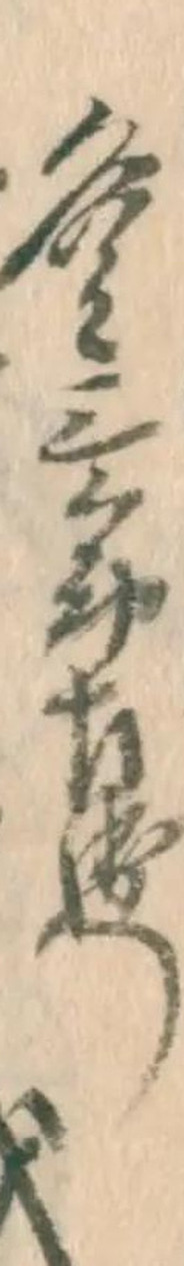名主三郎左衛門
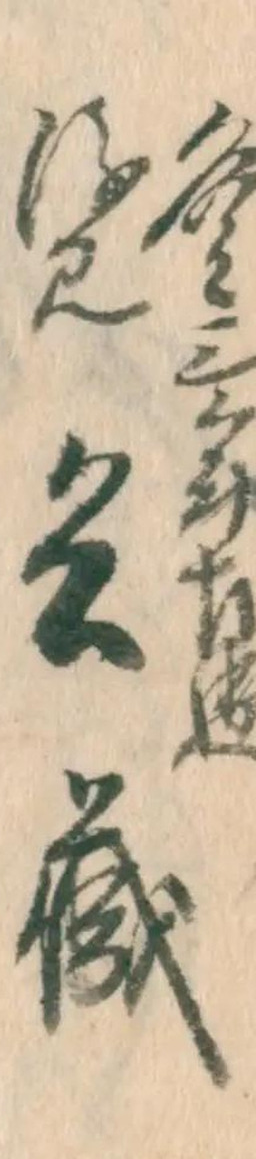後見兵蔵
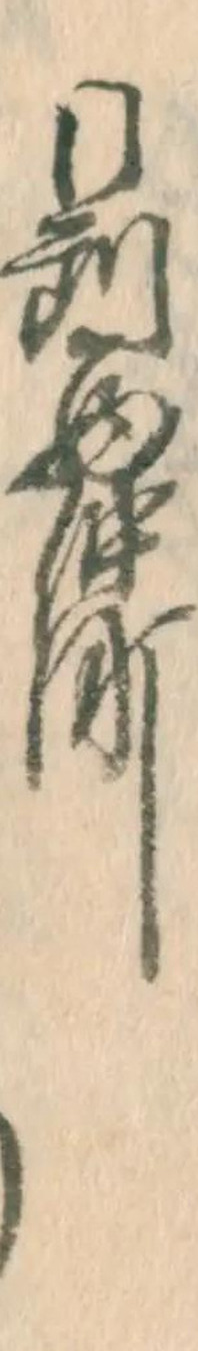同所西仲町
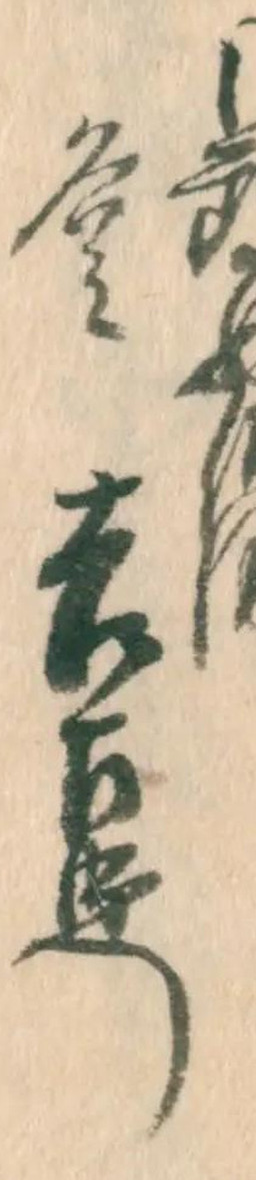名主吉左衛門

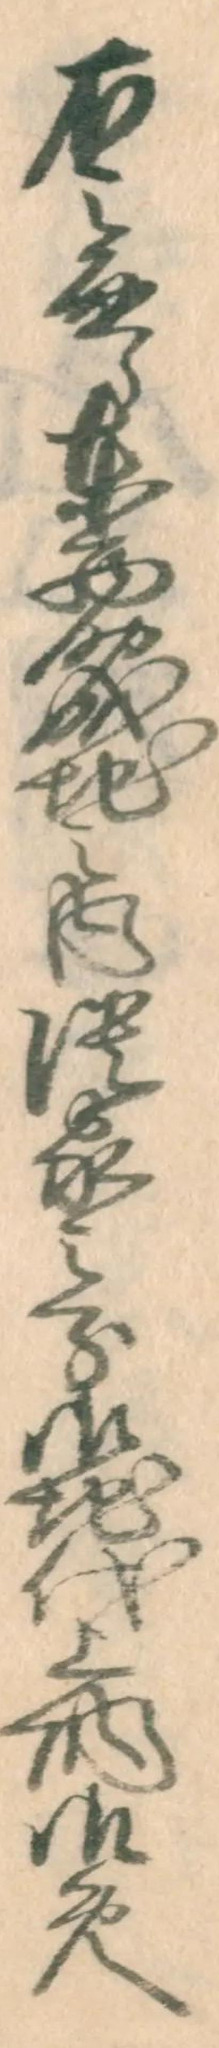右之通リ東西助成地之内潰家之分御地代上納御免
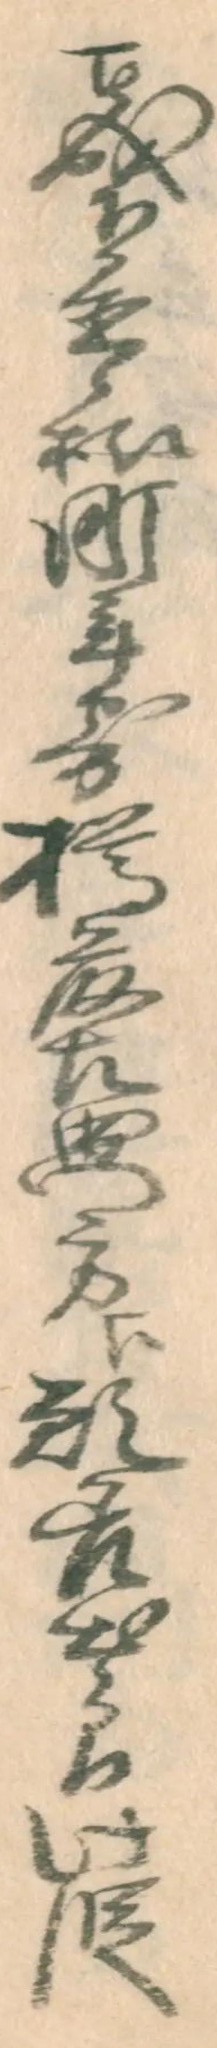被成下置候様町年寄樽藤左衛門方え願差出候間此段
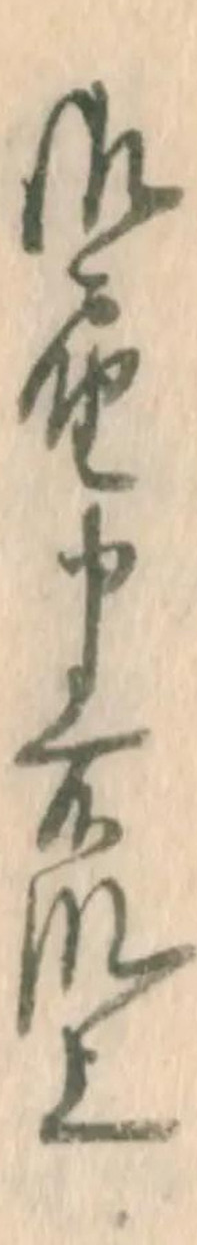御届申上候以上
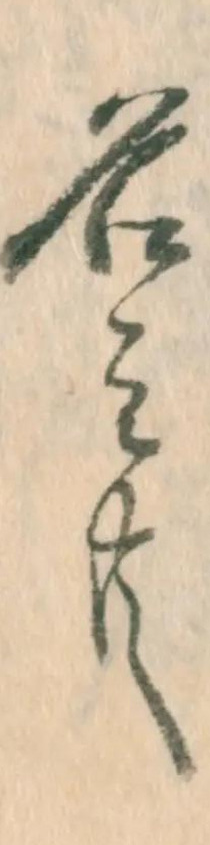名主共
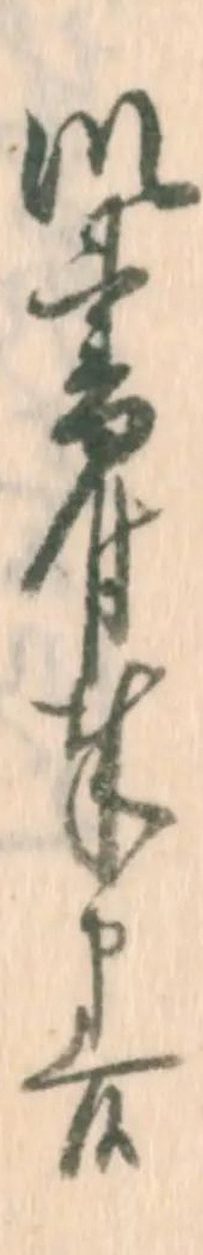以書付奉申上候
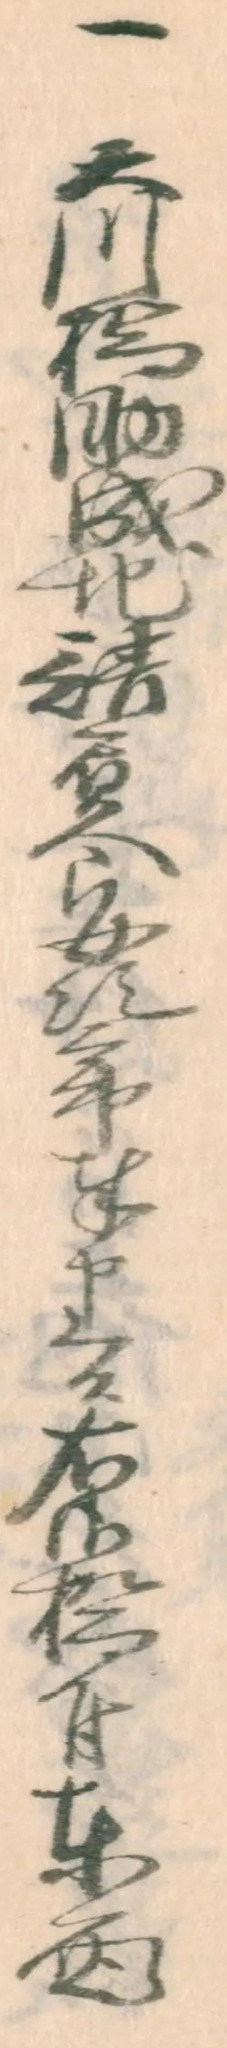一大川橋助成地請負人安次郎奉申上候右御橋付東西
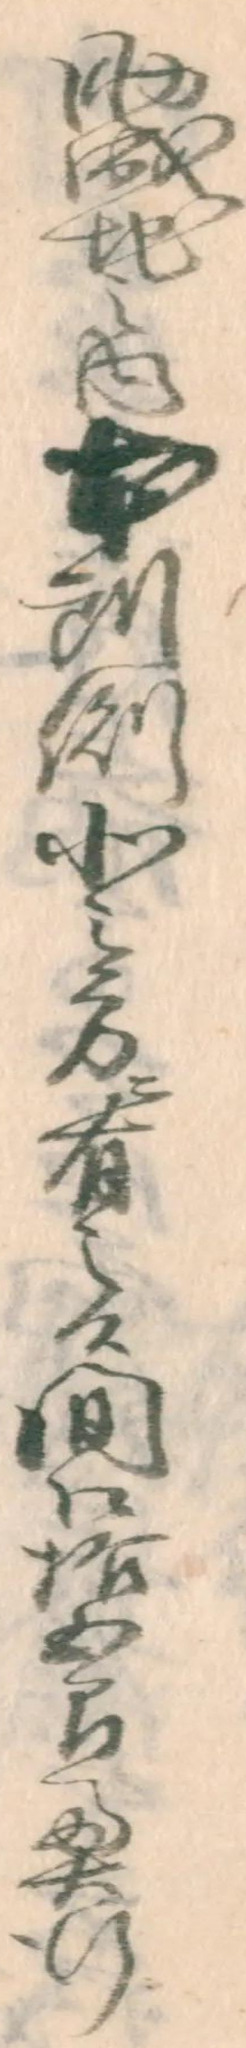助成地之内本所側北之方ニ有之候間口拾五間奥行
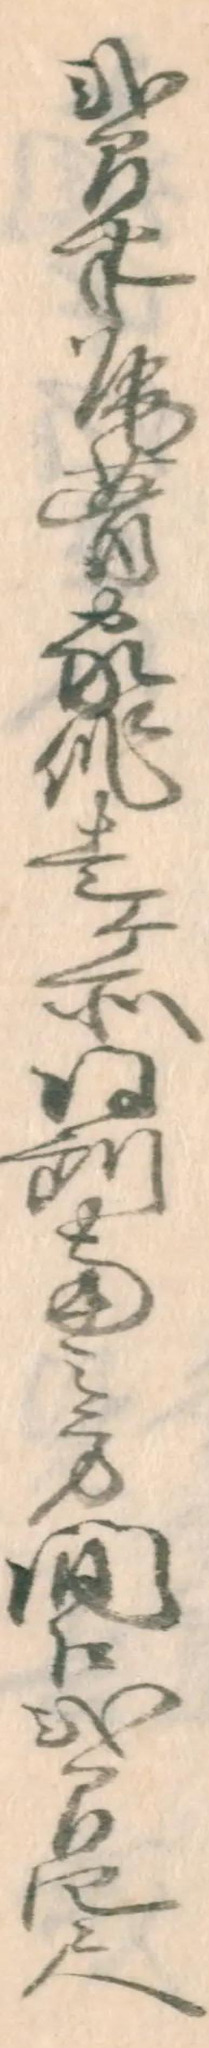弐間半瓦葺家作壱ヶ所同所南之方間口弐間四尺
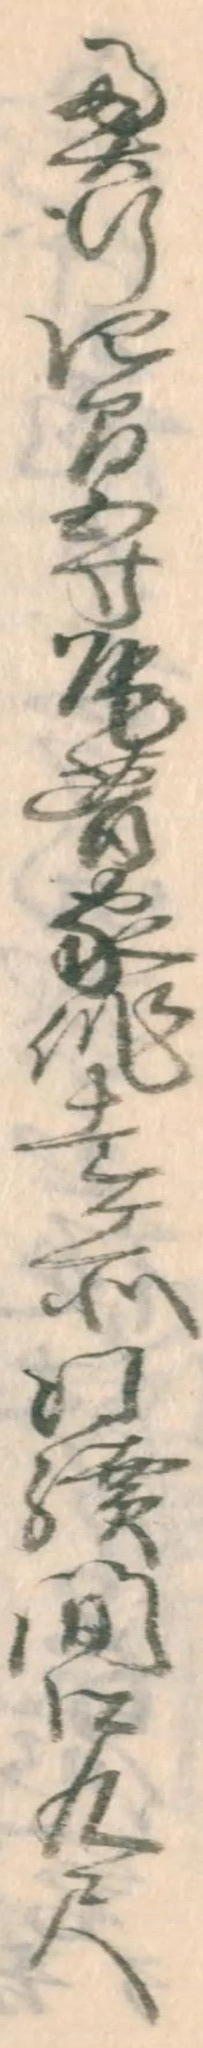奥行四間五寸瓦葺家作壱ヶ所同続間口九尺
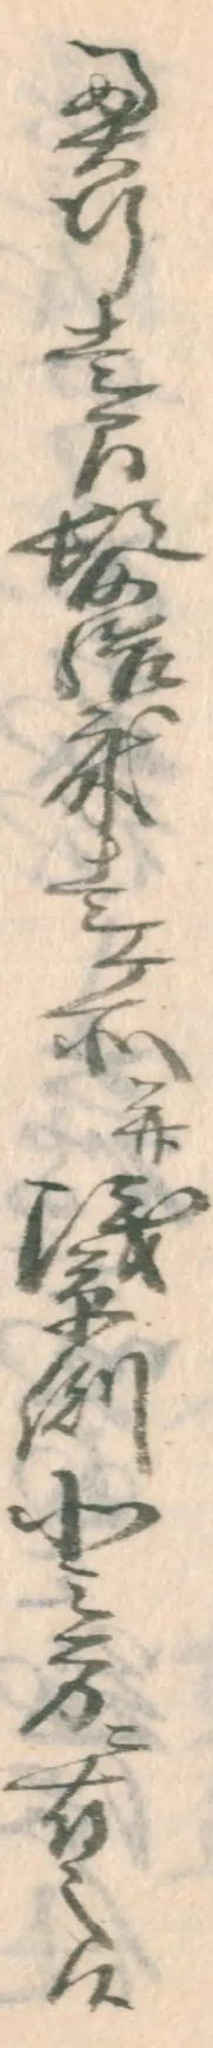奥行壱間髪結床壱ヶ所幷浅草側北之方ニ有之候
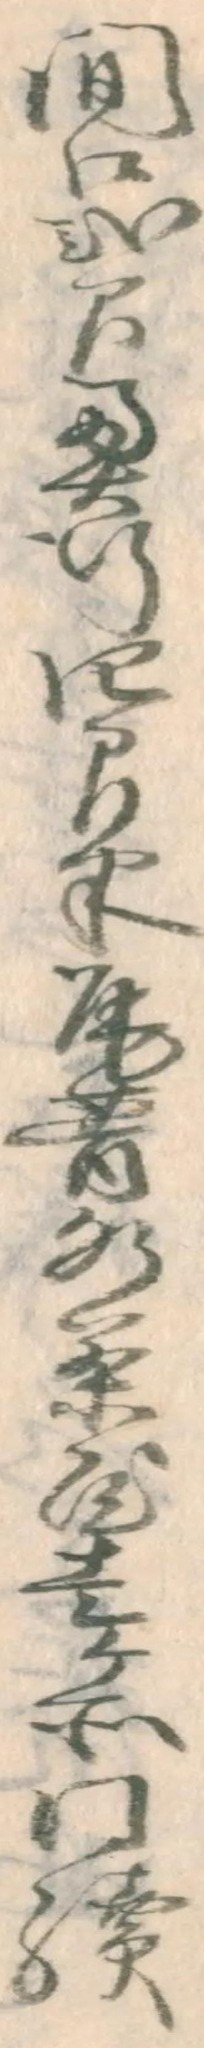間口弐間奥行四間半瓦葺水茶屋壱ヶ所同続
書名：地震災書留 2巻. [1] 内表紙に「地震災書留　安政二卯年　但本所深川御用屋敷地代免除調」とあり
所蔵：国立国会図書館 National Diet Library, JAPAN
